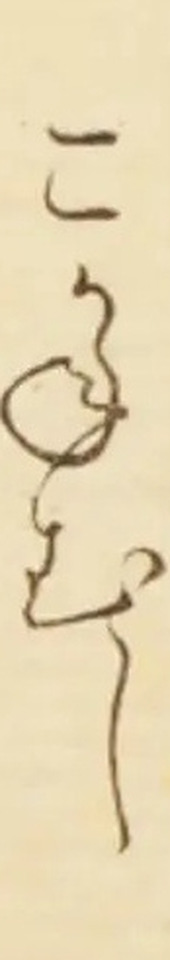こかねむし
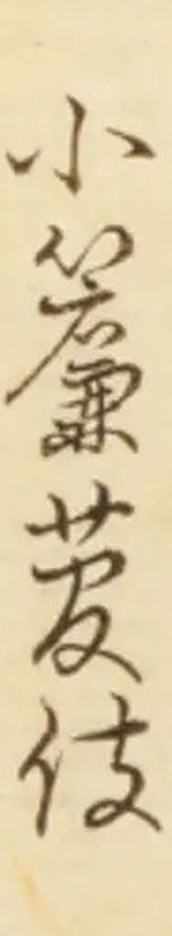小簾菅伎
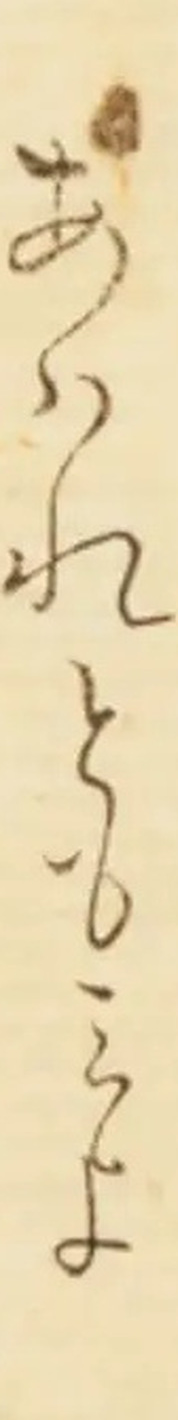あはれともみよ
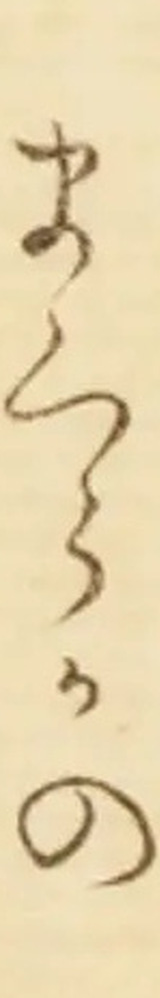まくらかの
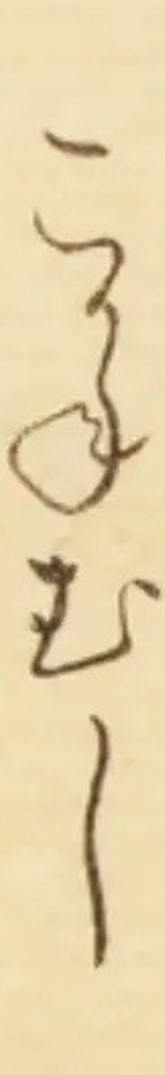こかねむし
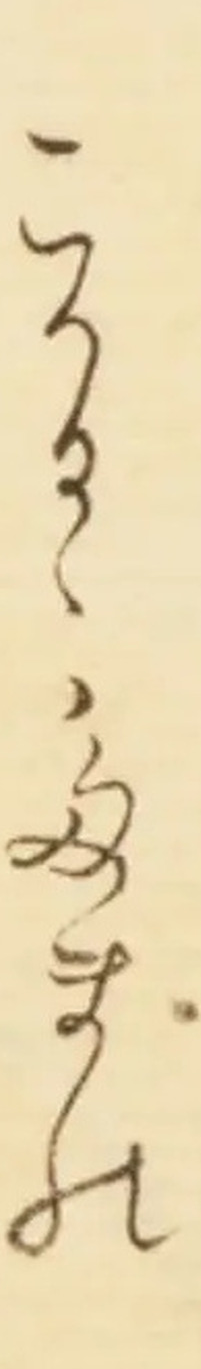こかるゝたまの
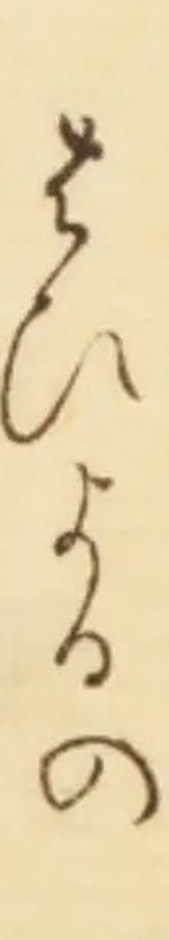はひよるの

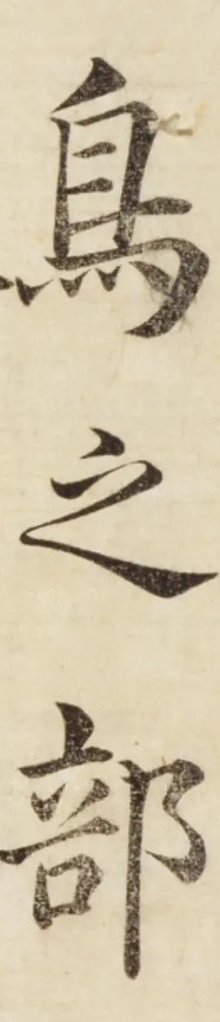魚之部
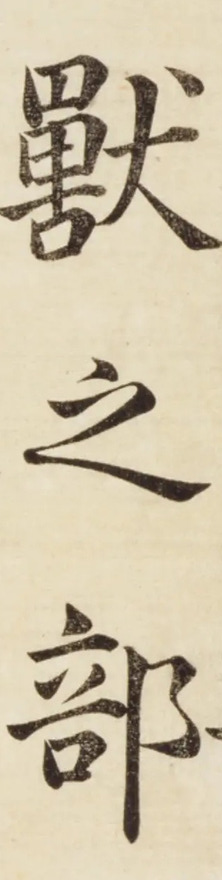魚之部
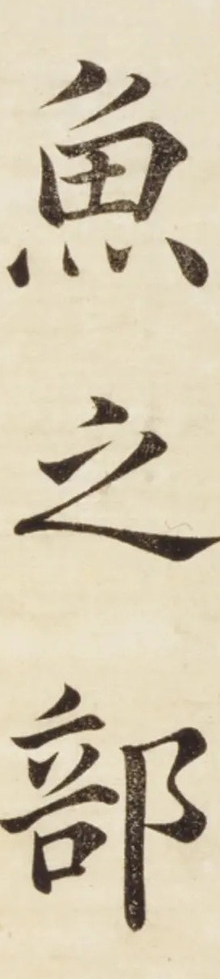魚之部
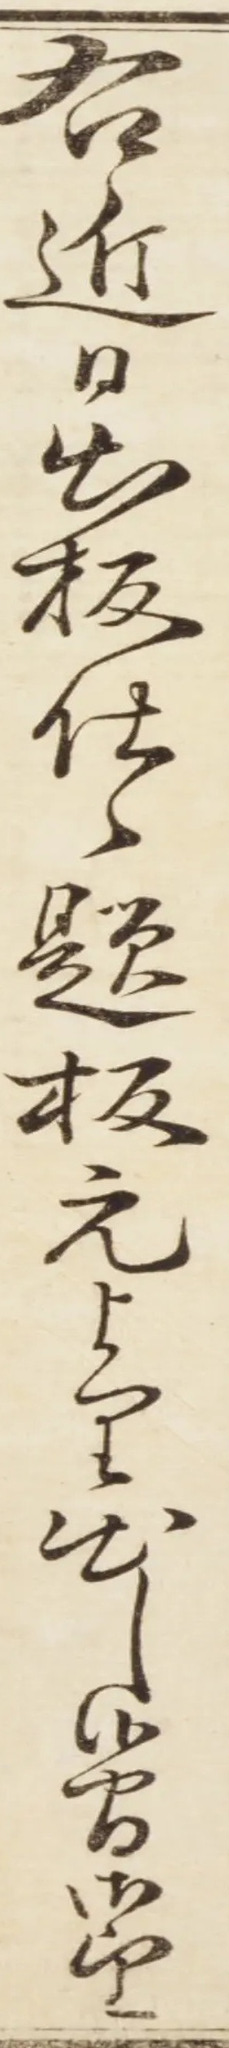右近日出板仕候題板元より出し候間御望
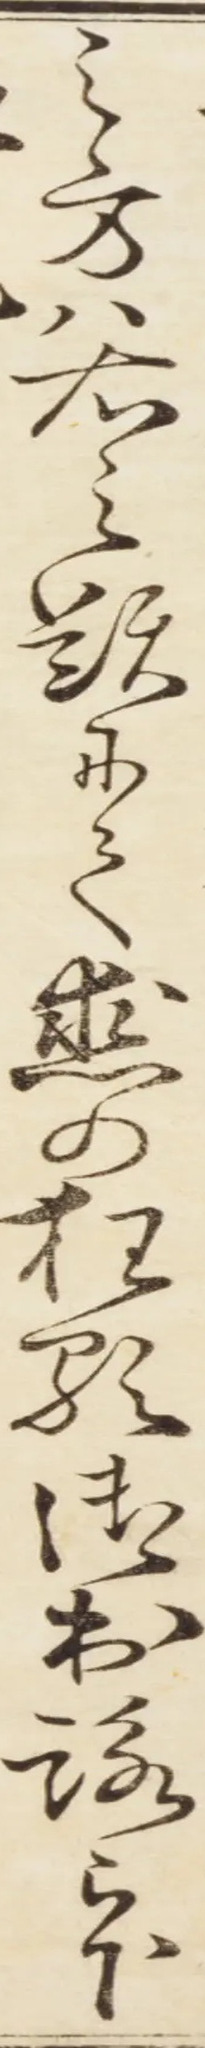之方は右之題にて恋の狂歌御出詠被下
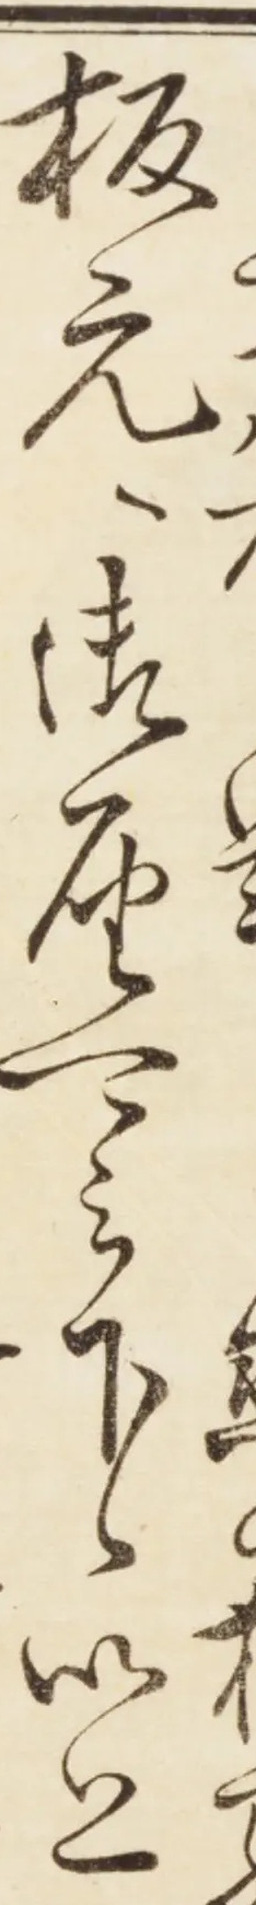板元へ御届可被下候以上
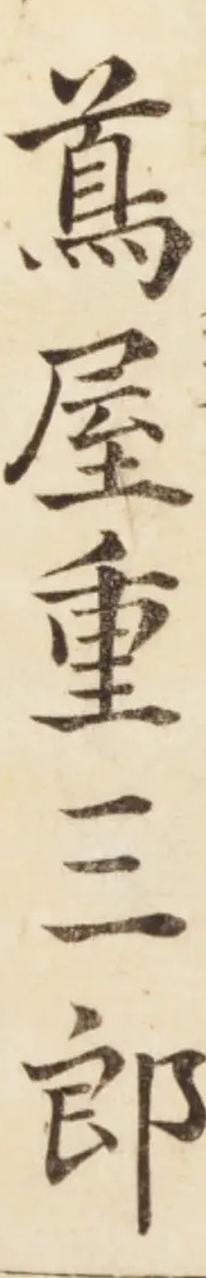蔦屋重三郎
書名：画本虫ゑらみ
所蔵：国立国会図書館 National Diet Library, JAPAN
